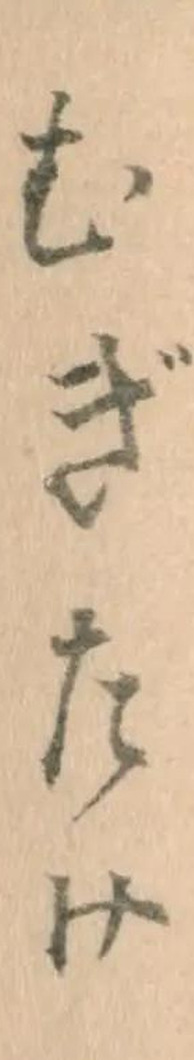むぎたけ
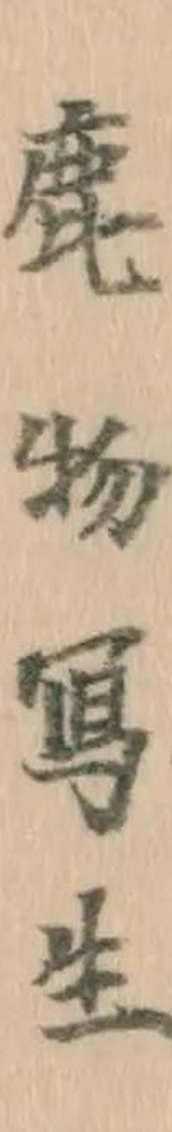鹿物写生
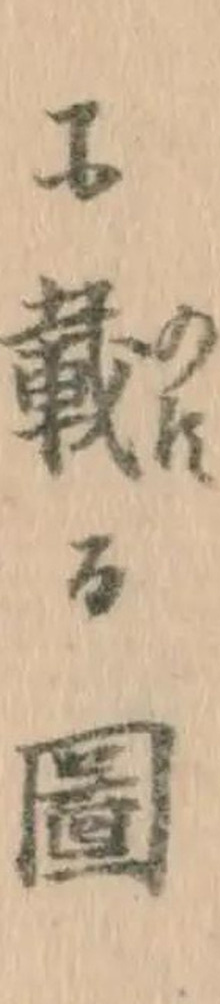に載る図

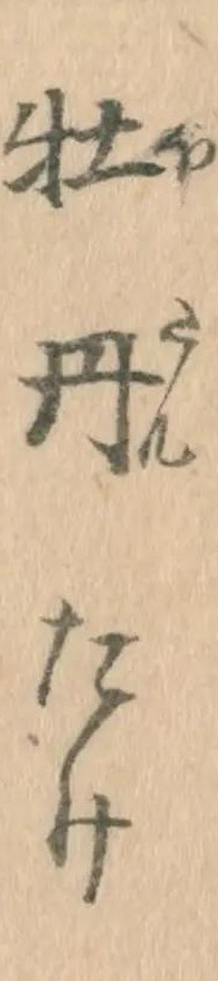牡丹たけ
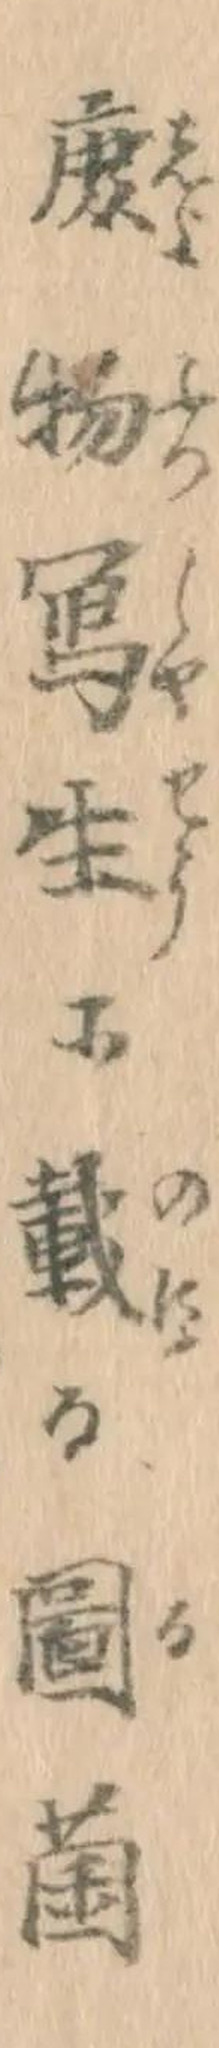庶物写生に載る図菌
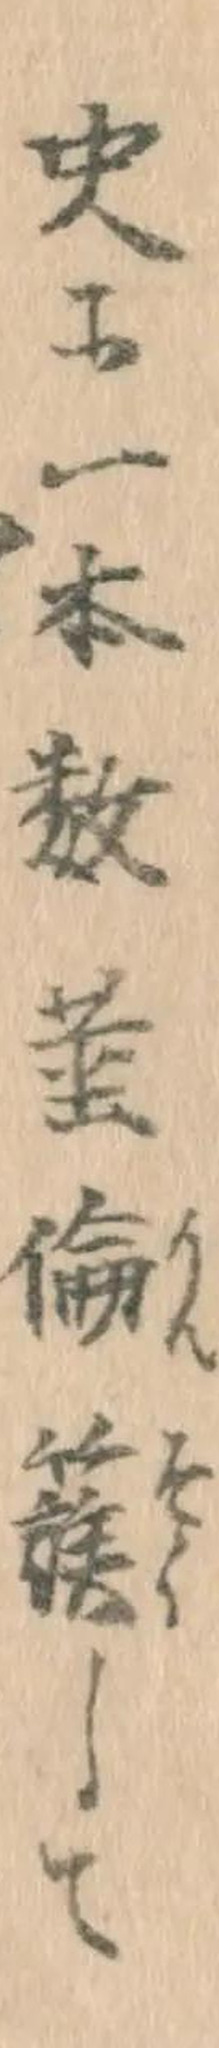史に一本数茎倫簇して
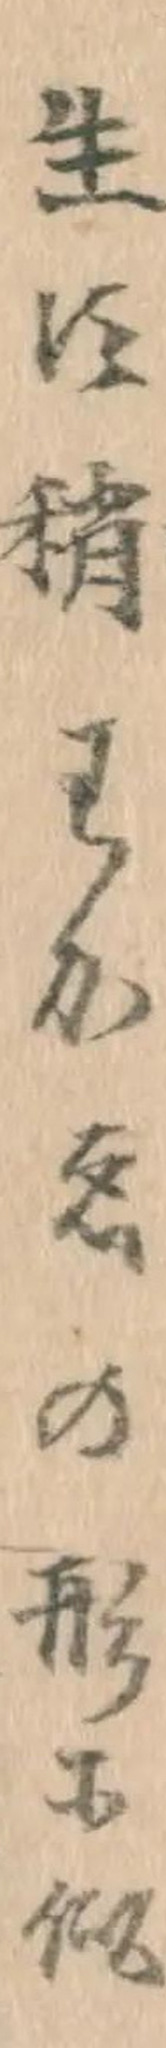生す稍わかゑの形に似
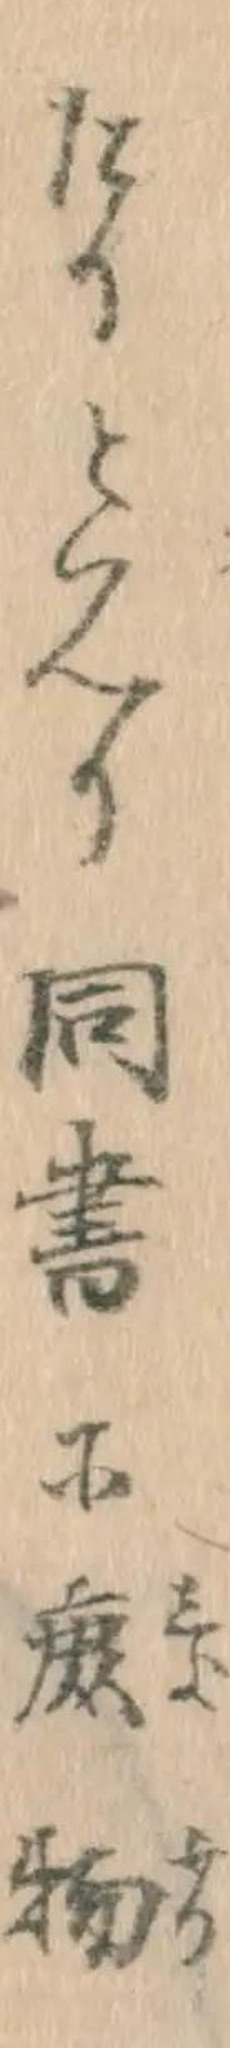たりといへり同書に庶物
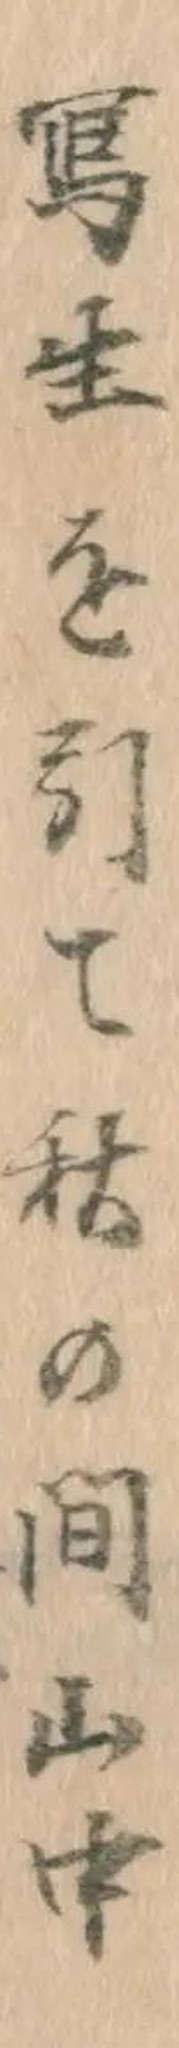写生を引て秋の間山中
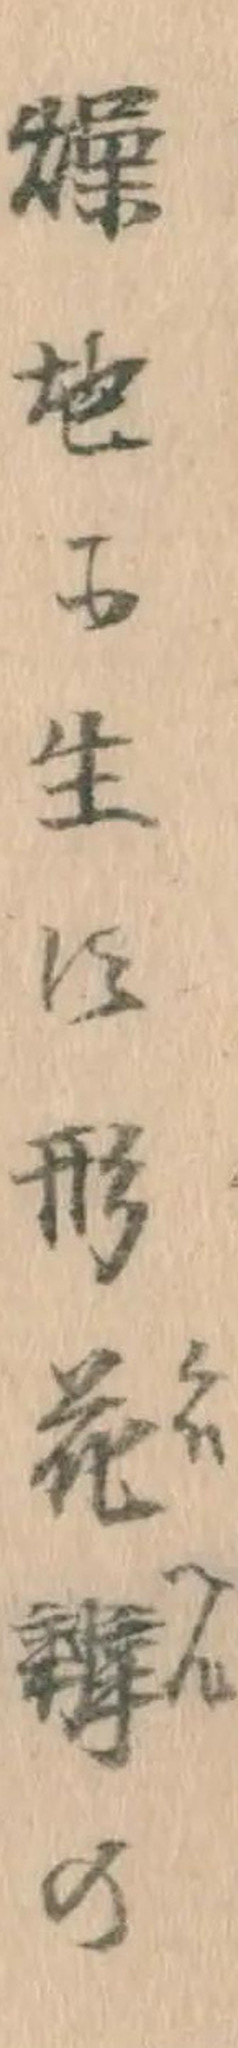燥地に生す形花弁の
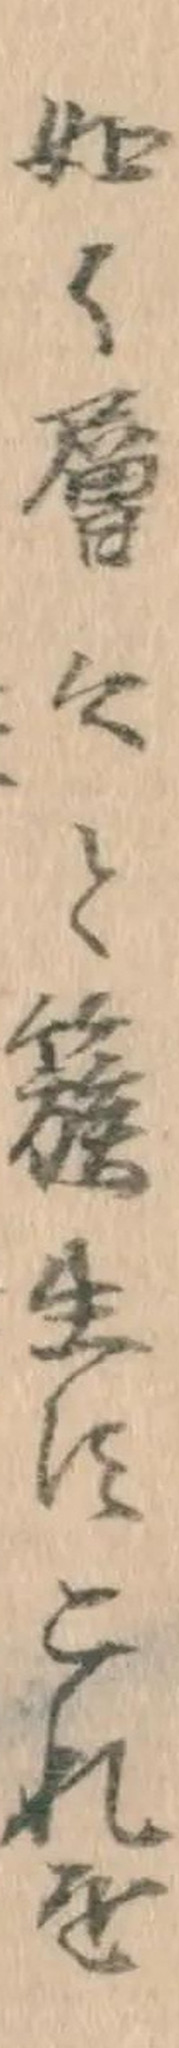如く層々と簇生すこれを
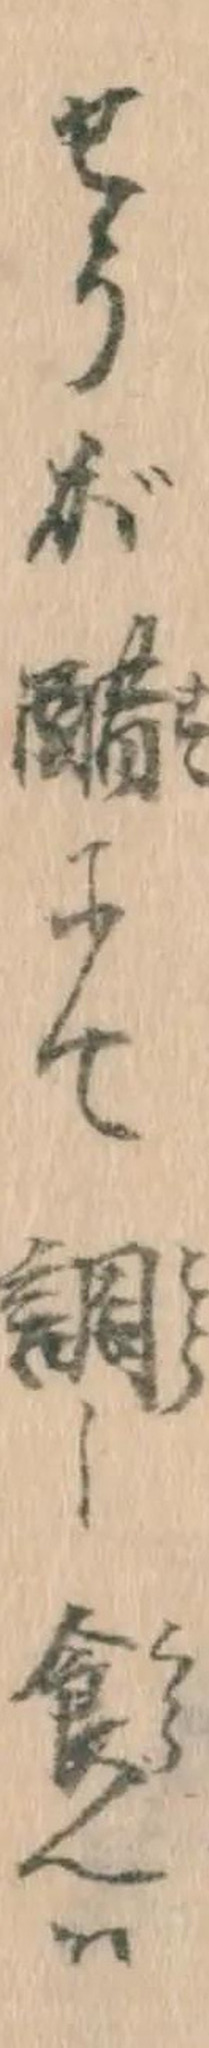せうが酢にて調し食へは
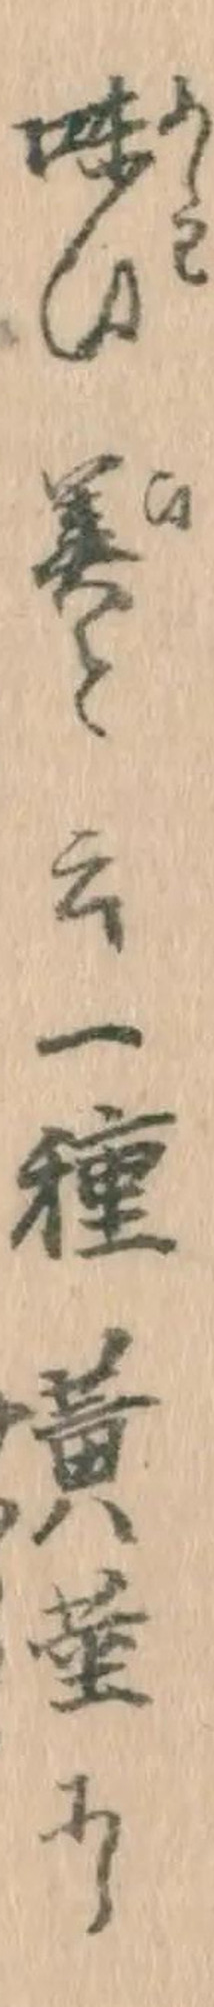味ひ美と云一種黄茎にし
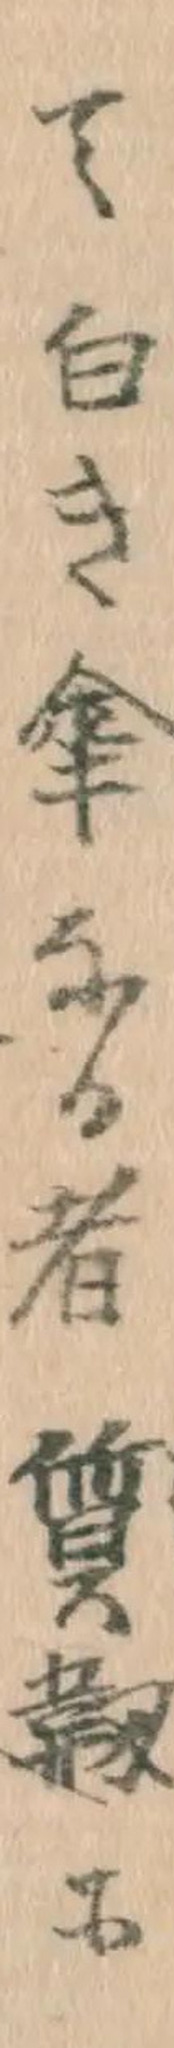て白き傘なる者質韌に
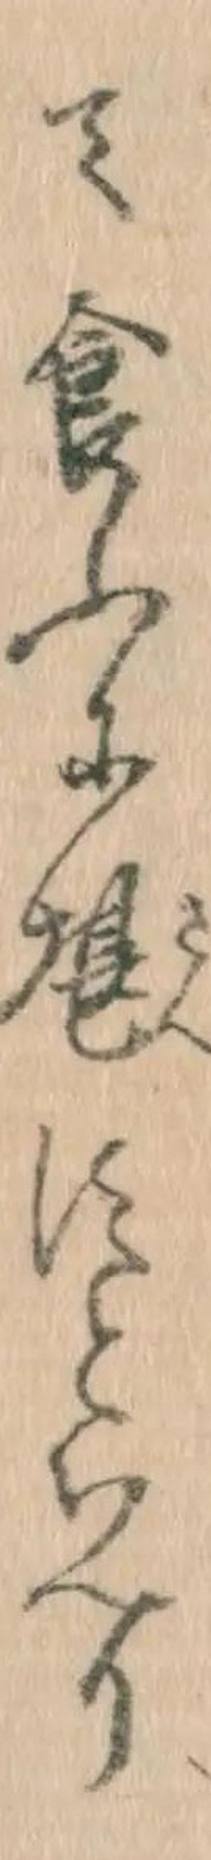て食ふに堪すといへり
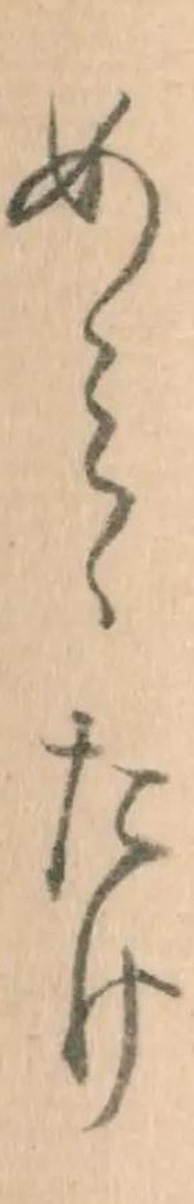めみゝたけ
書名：本草図譜. 巻58-60
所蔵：国立国会図書館 National Diet Library, JAPAN
